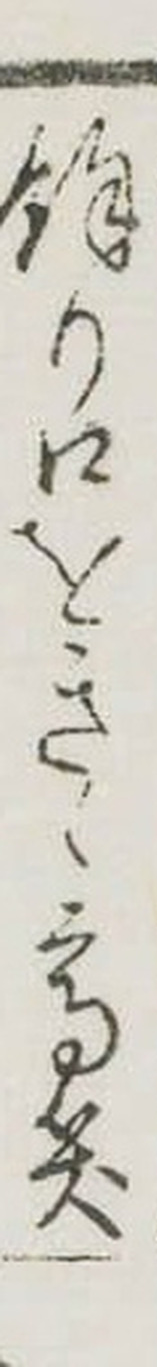余り口をきゝ高笑
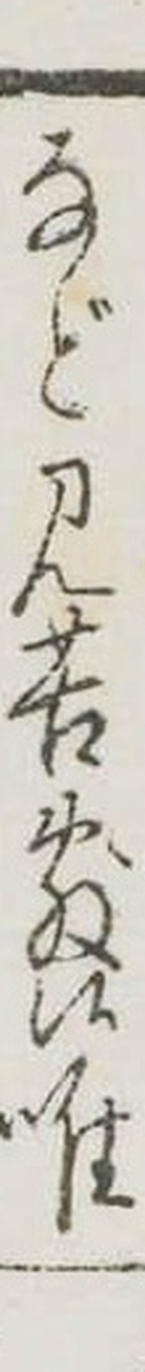など見苦敷候唯
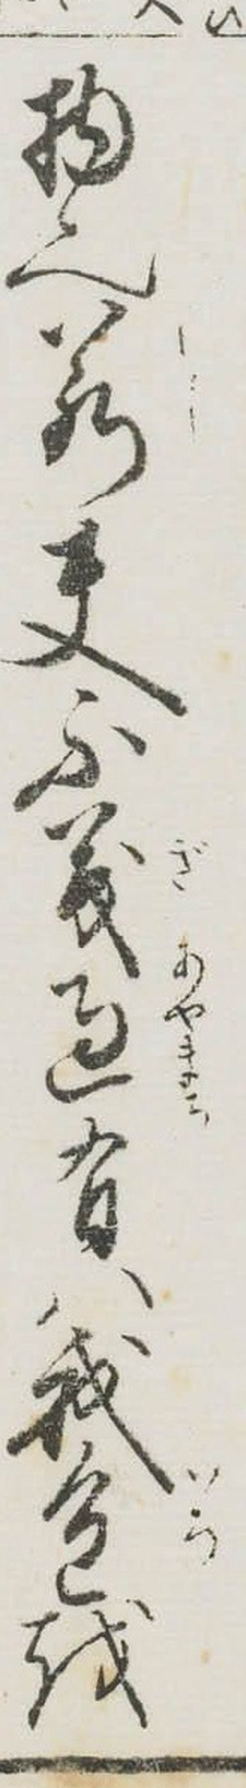物也若夫ふ義過有は我色を
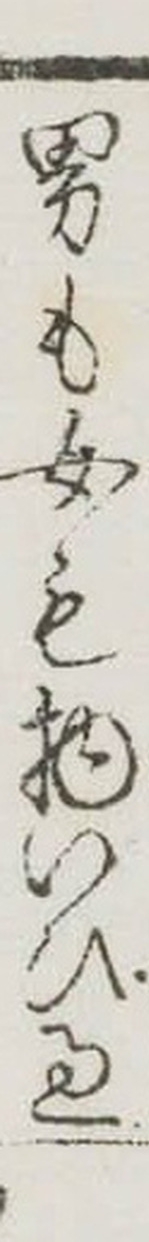男も女も物いひ過
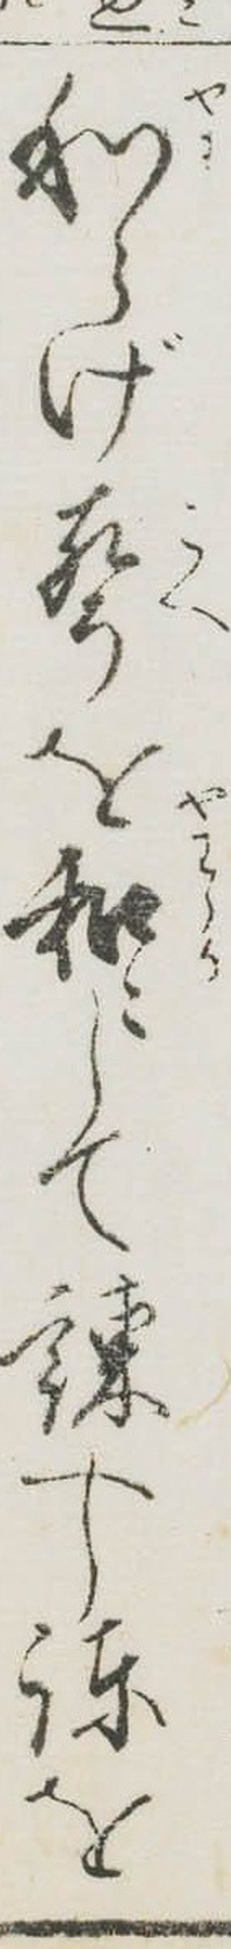和らげ声を和諫へし諫を
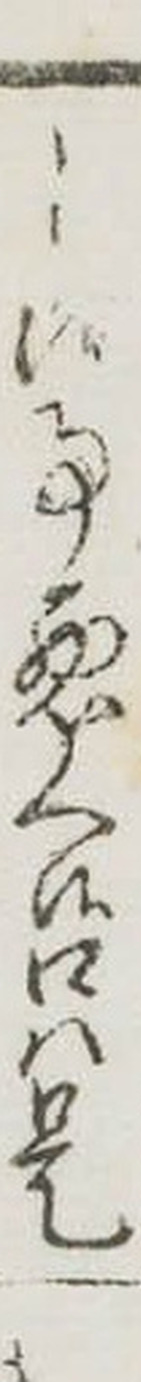し候事悪く候口は是
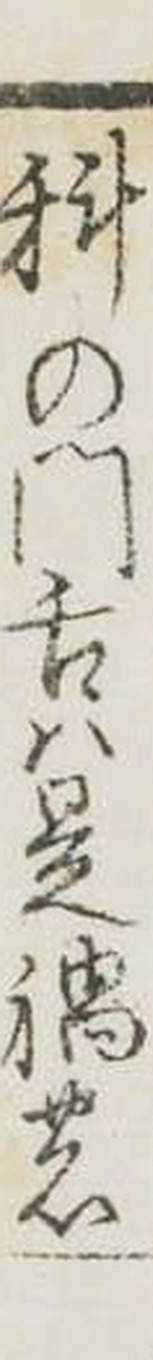科の門舌は是禍の
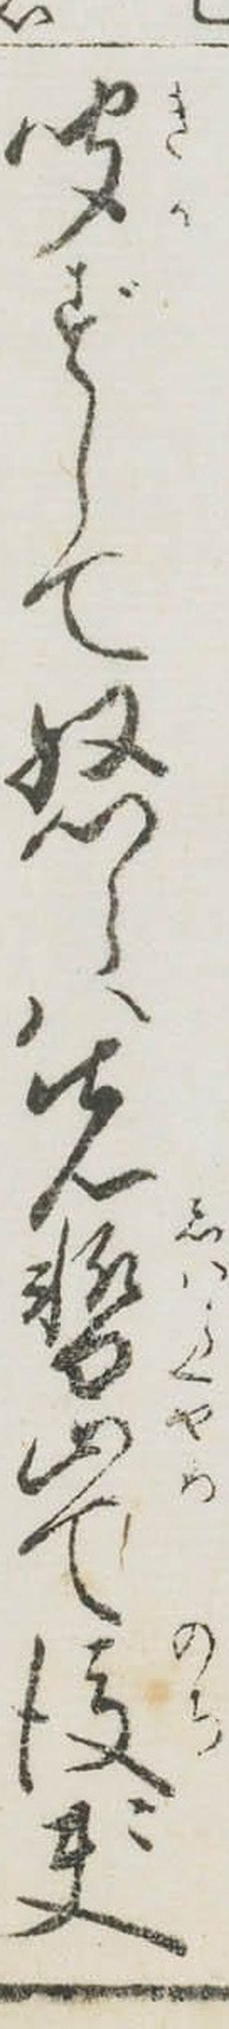聞ずして怒らは先暫止て後夫
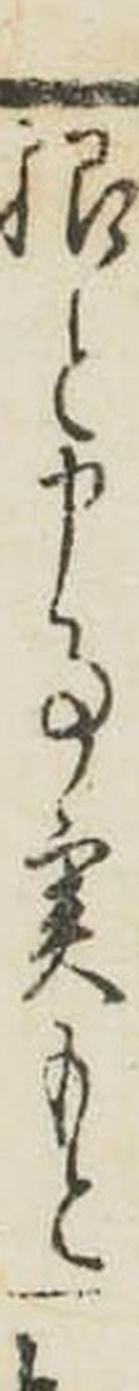根と申事実もと
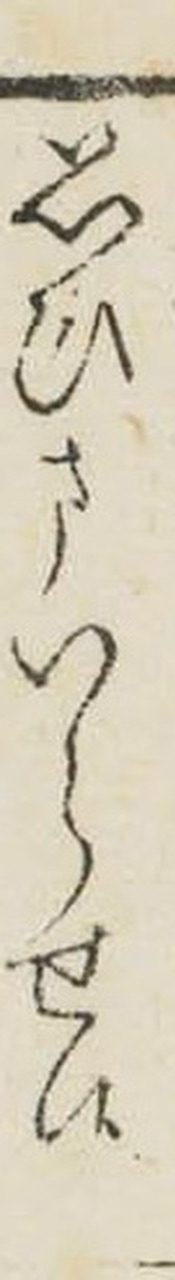思ひまいらせ候
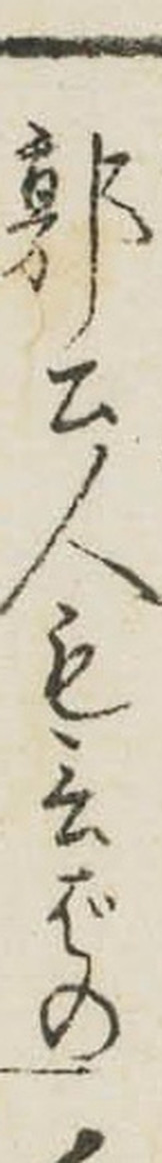郭公人も言ばの
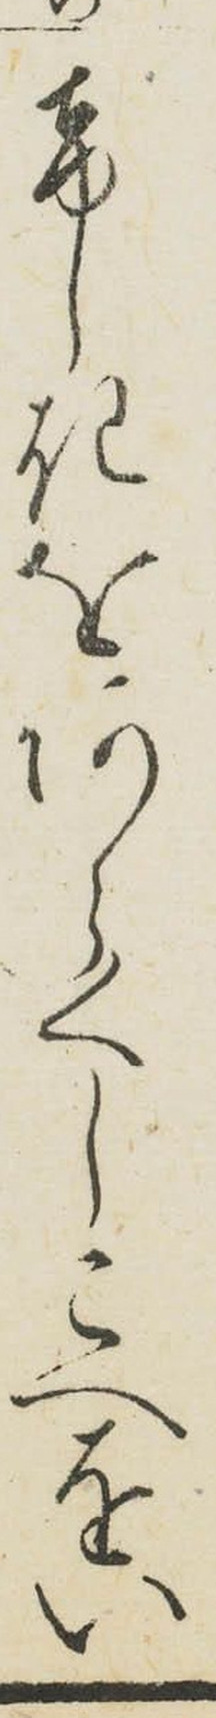けしきをあらくしこへをい
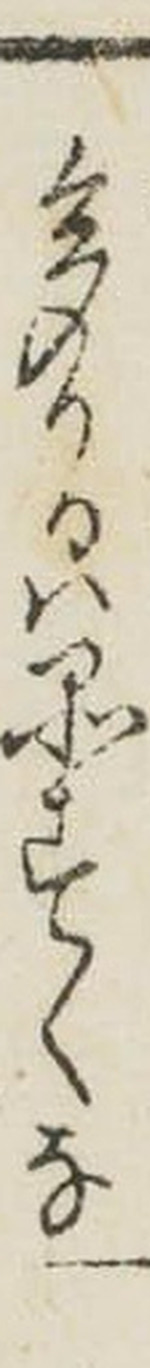多かるは品すくな
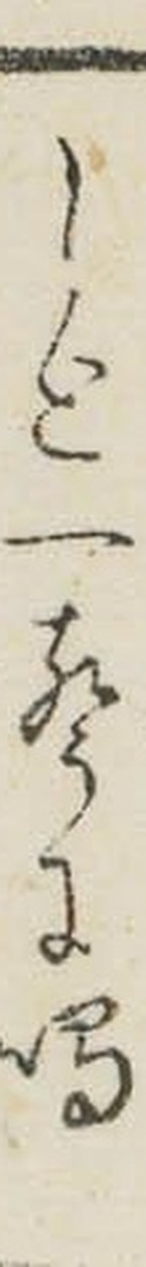しと一声に鳴
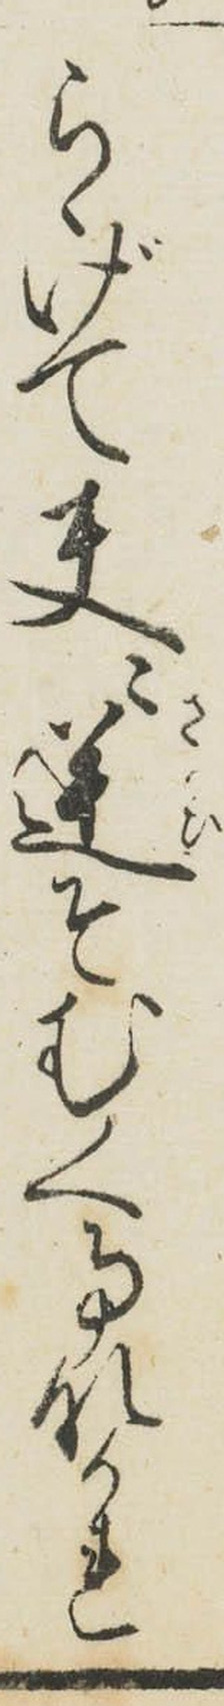らゝげて夫逆そむく事なかれ
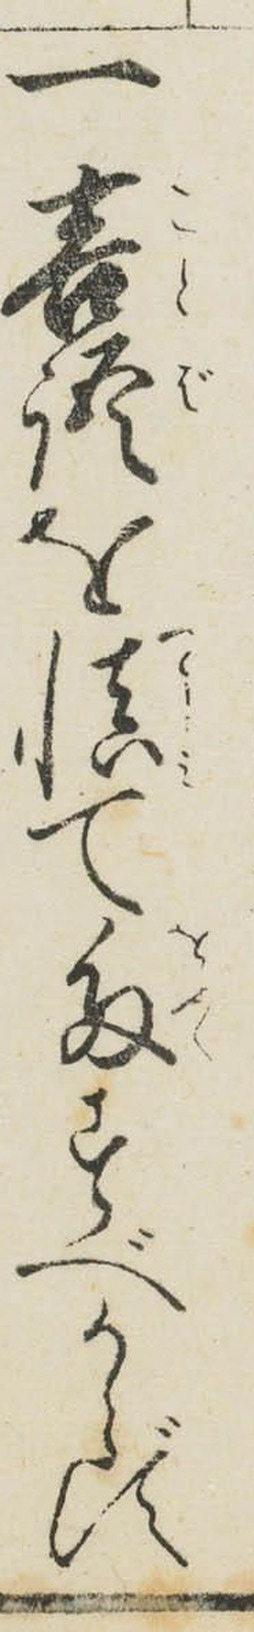一言語を慎て多すべからず
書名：女大学
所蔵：東京学芸大学教育コンテンツアーカイブ
